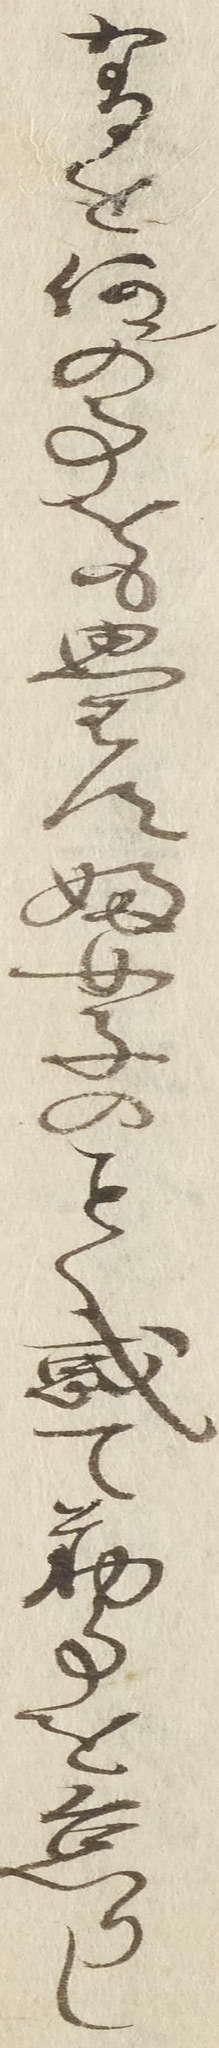なるを何レの事をも思はす婦女子のことく惑て勤事を怠りし
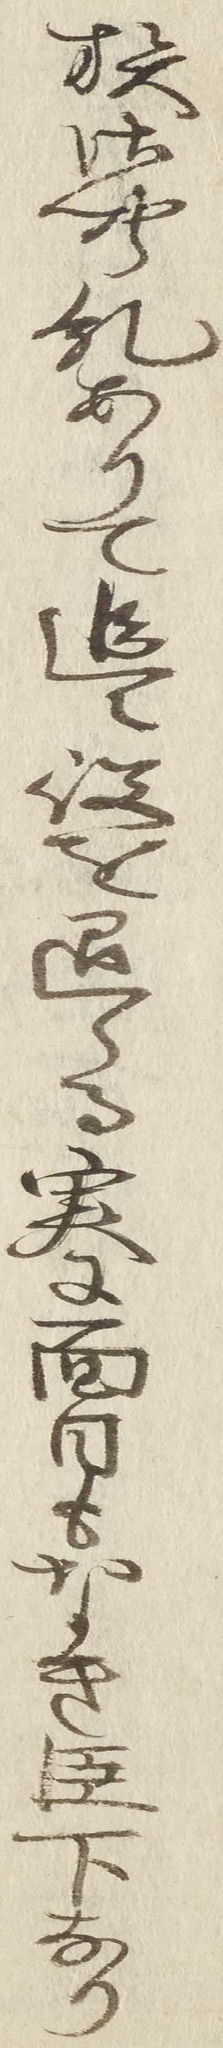様御聞糺ありて追々役を退たる実に面目もなき臣下なり
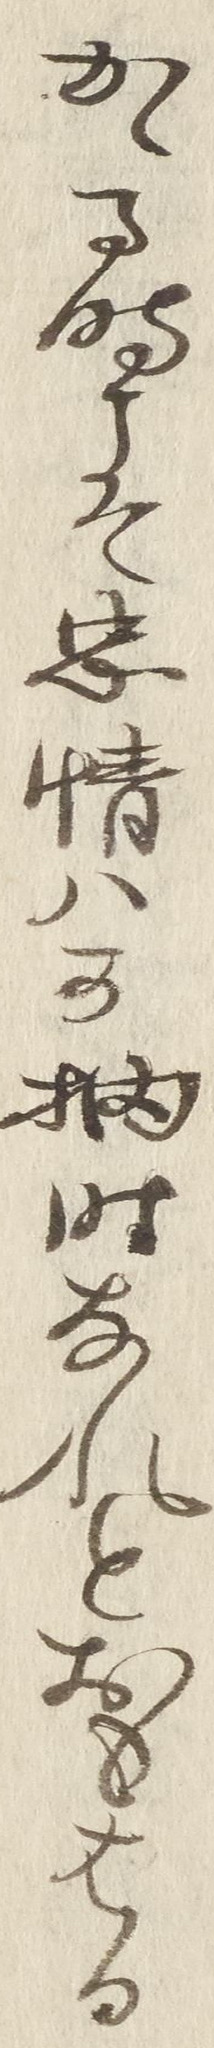かゝる時こそ忠情は可抽時なれとおもはる
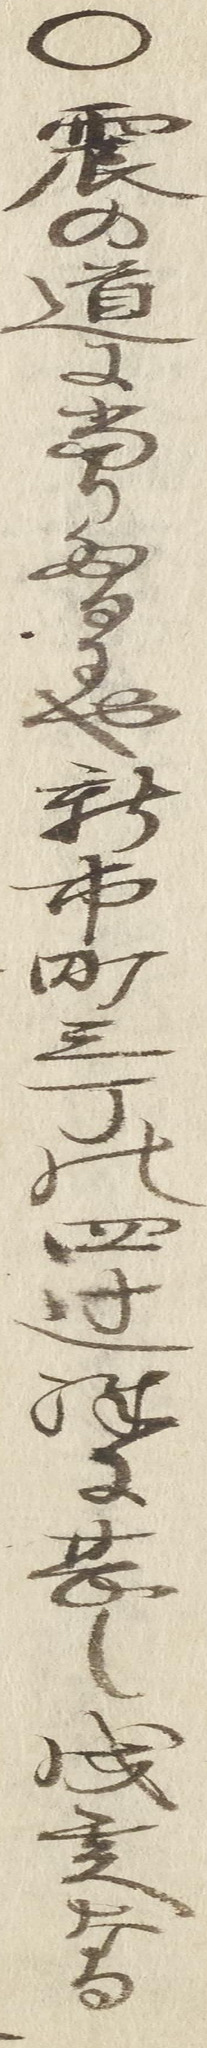○震の道に当りたるにや新市町三丁の四辻誠に甚し戌亥なる
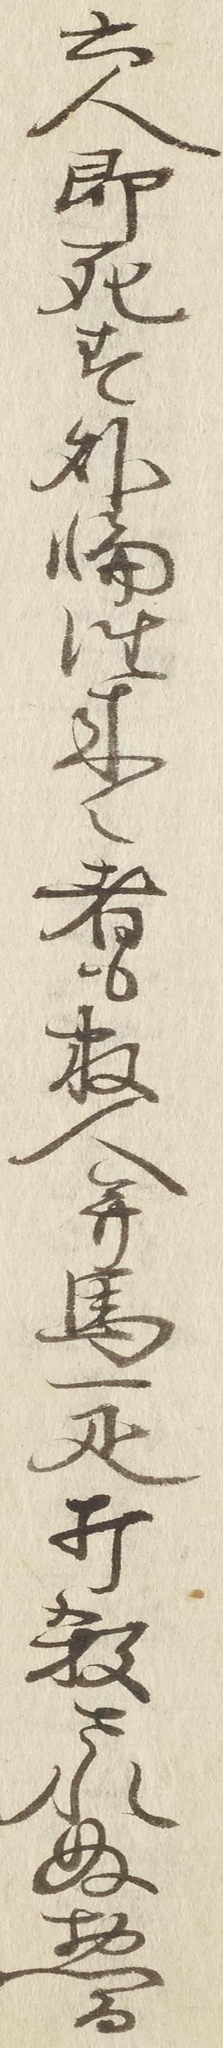六人即死す外輪往来の者も数人幷馬一疋打殺されぬ惣て
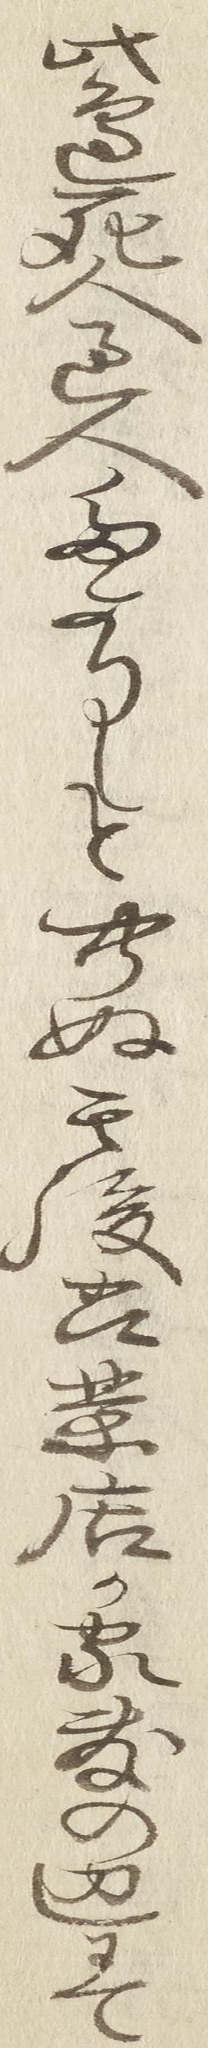此辺死人過人多かりしと聞ぬ其後宿業店の家敷の辺にて
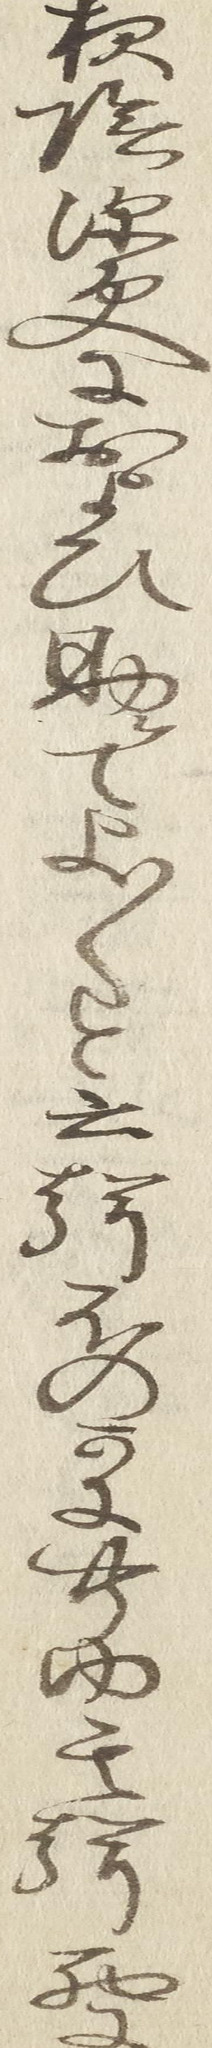夜陰深更におよひ助ヶてよ〳〵と云声ほのかに聞ゆ其声西に
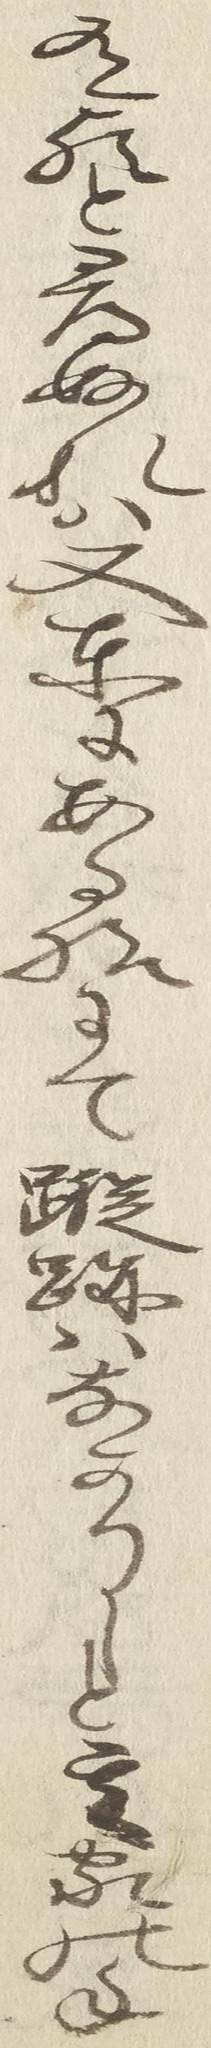有歟と尋ぬれは又東にある様にて蹤跡はなかりしと其家の手
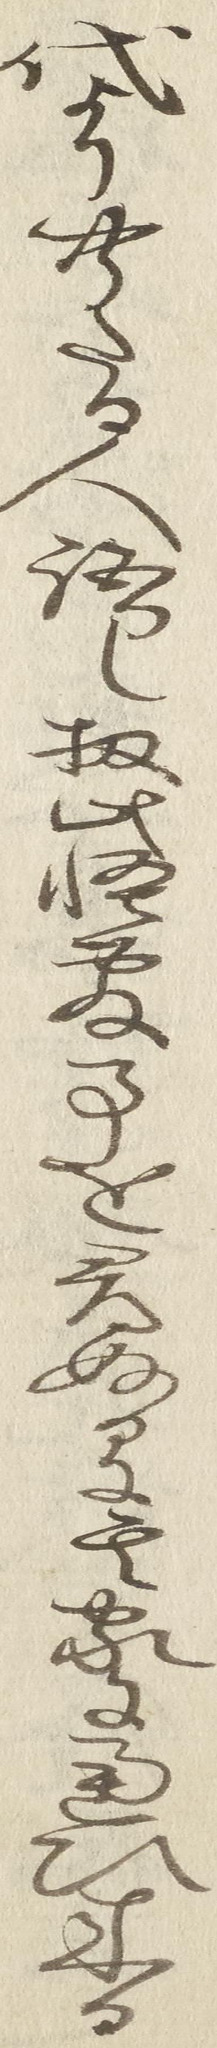代より聞たる人語し扨此怪敷事を尋ぬるに通ひ来る
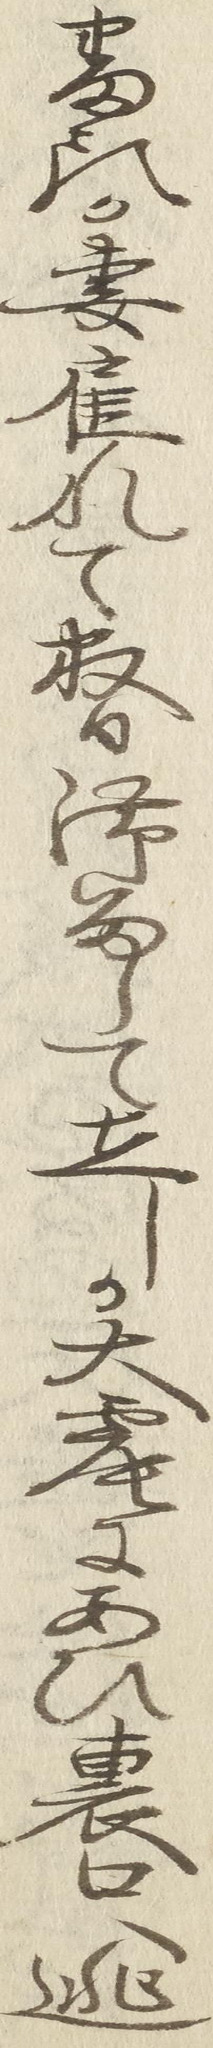番頭か妻雇れて数日滞留して在しか大震にあひ裏口へ逃
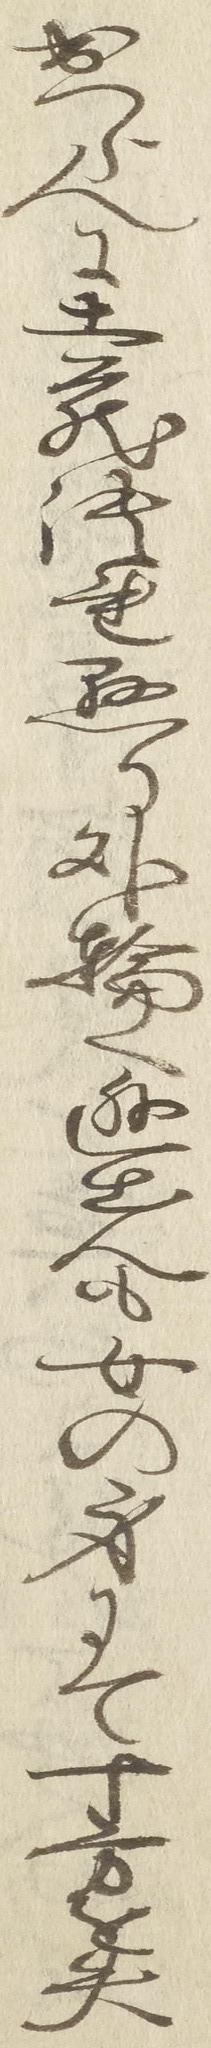出つらんに土蔵潰れ懸り外輪へ逃出んも女の身にて十方を失
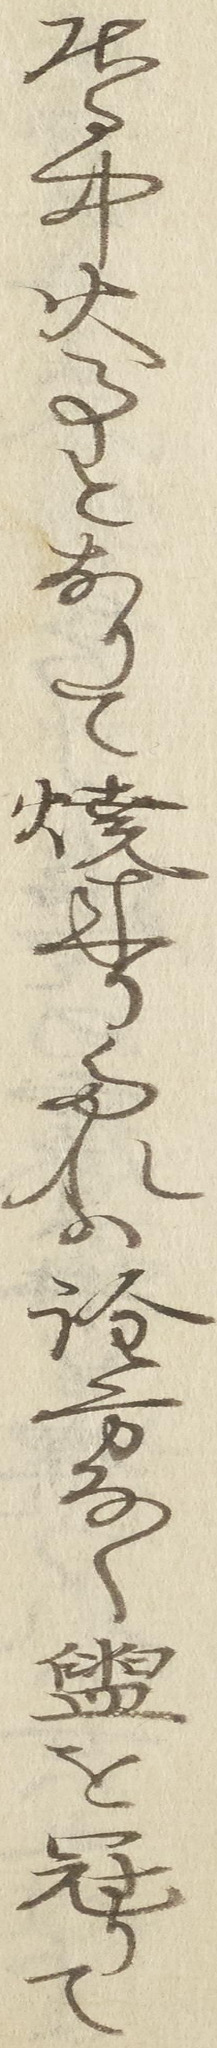居る中火事となりて焼来りたれは詮方なく盥を冠りて

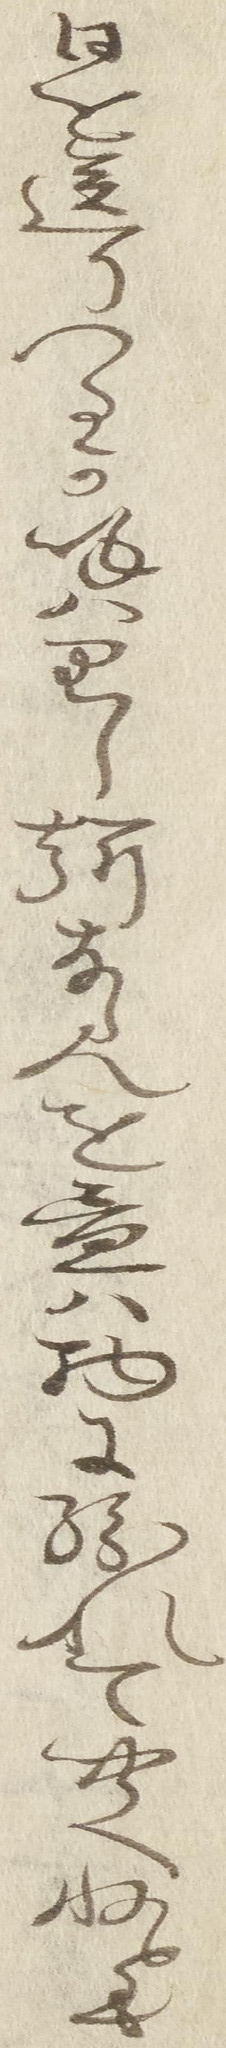日を送りつるか呼はりし聲ならんを昼は物に紛れて聞へねども
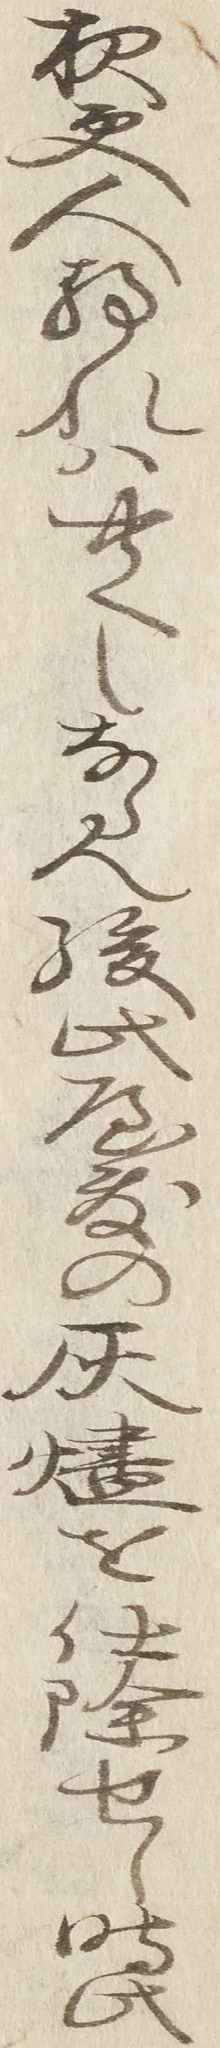夜更人到れは聞へしならん後此屋敷の灰燼を仕除せし時此
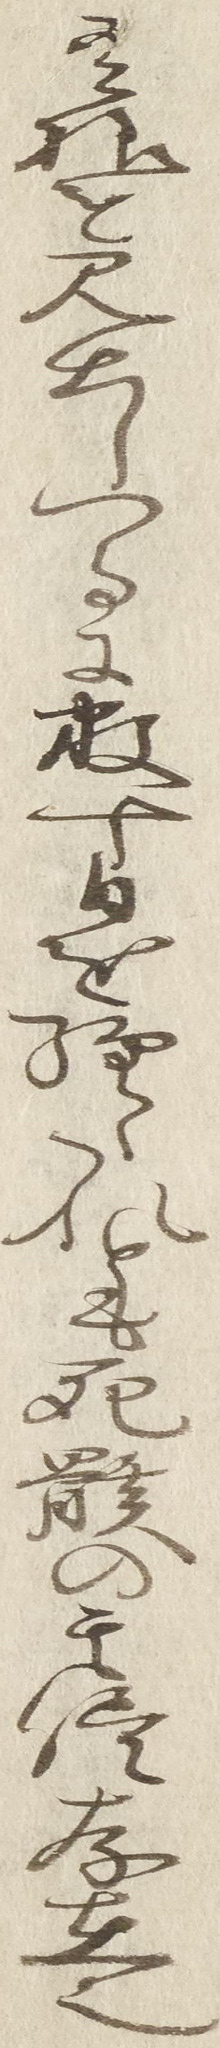有様を見出しつるに数十日を経たれとも死骸の其儘存在也
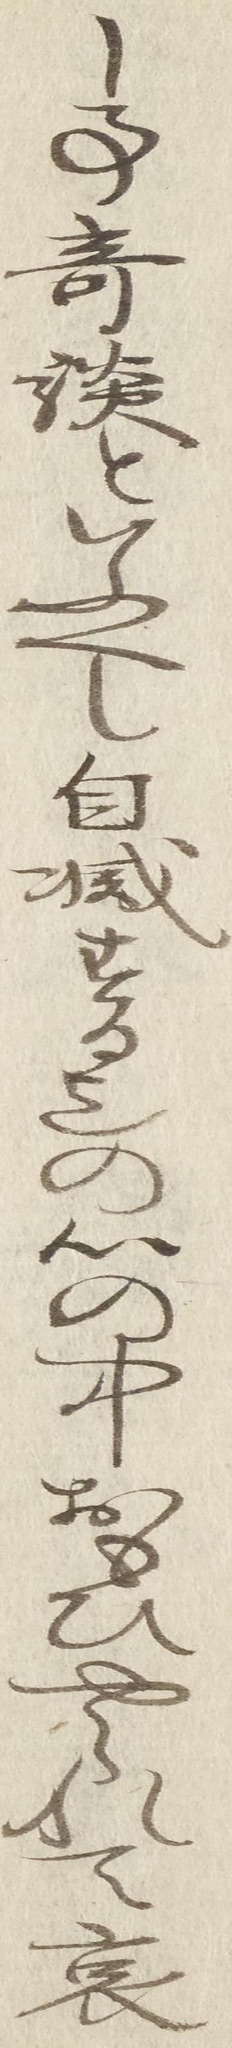し事奇談といふへし自滅する迄の心の中おもひやられて哀
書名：地震記　上
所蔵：東京大学地震研究所図書室 Earthquake Research Institute Library, The University of Tokyo, JAPAN
